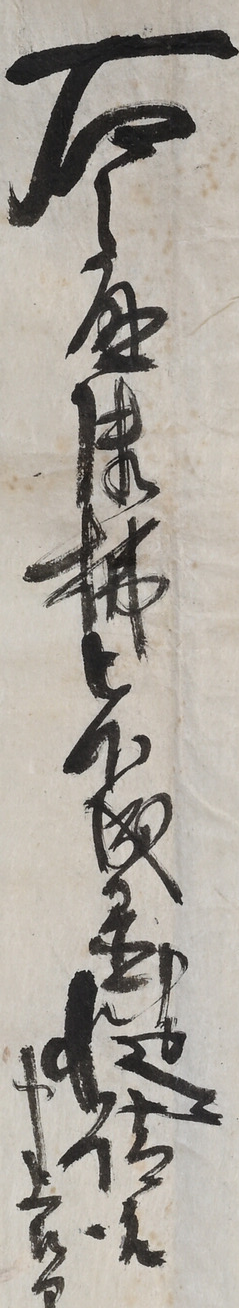右之通御払被下成置慥ニ請取
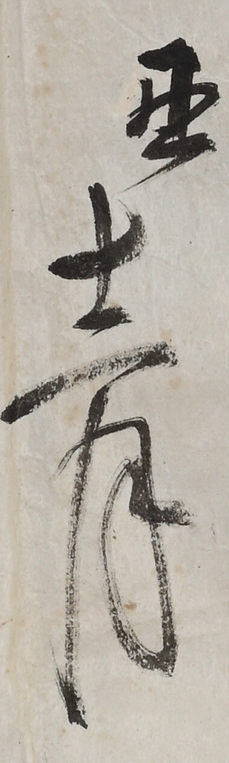丑十二月
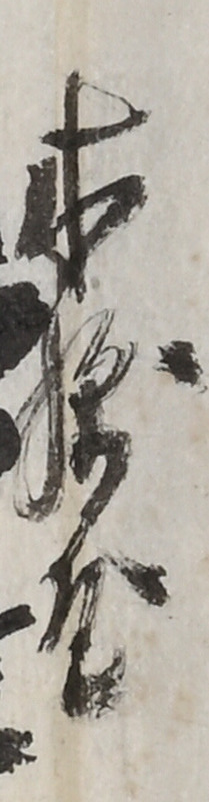木綿屋
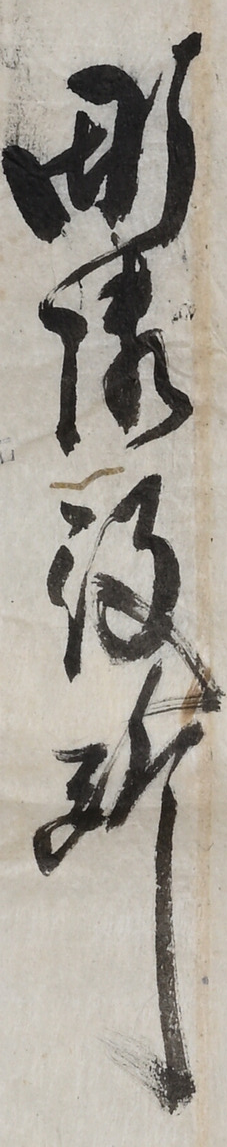町御役所

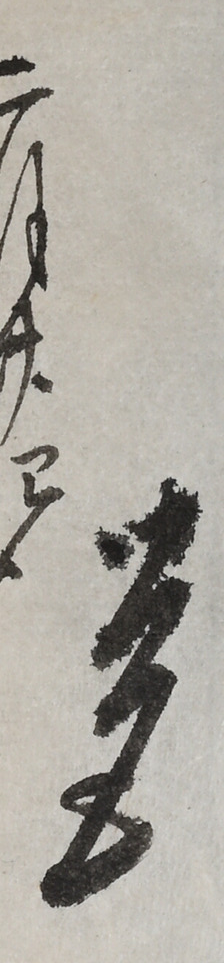二月廿四日
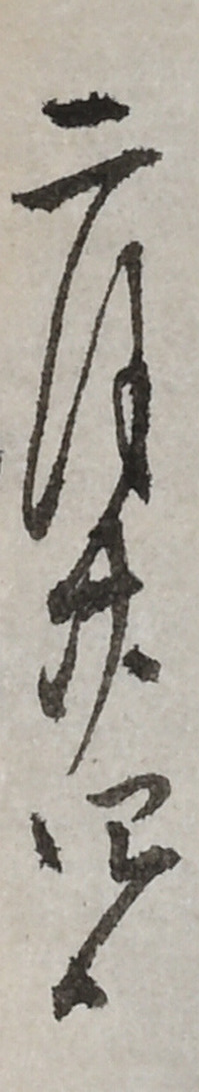二月廿四日
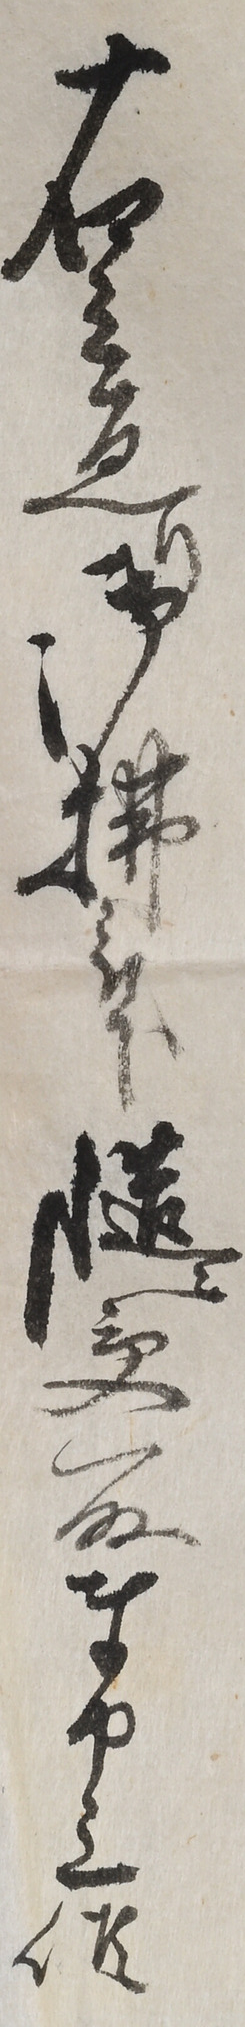右之通り御払被下慥ニ受取奉申上候
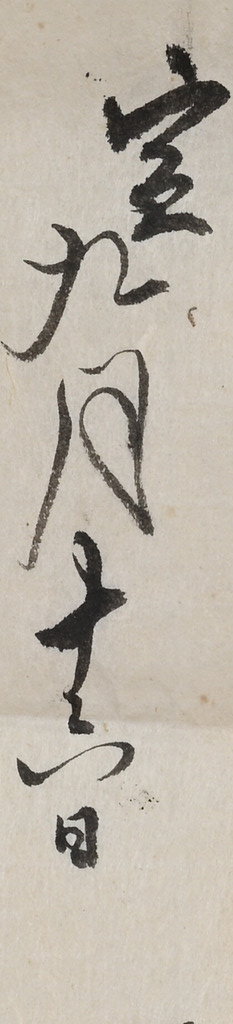九月十六日
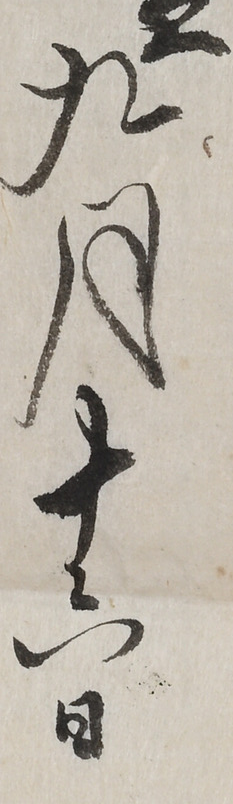九月十六日
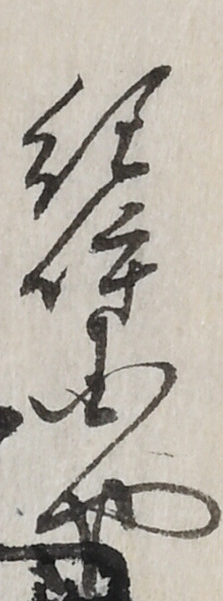紀伊国や
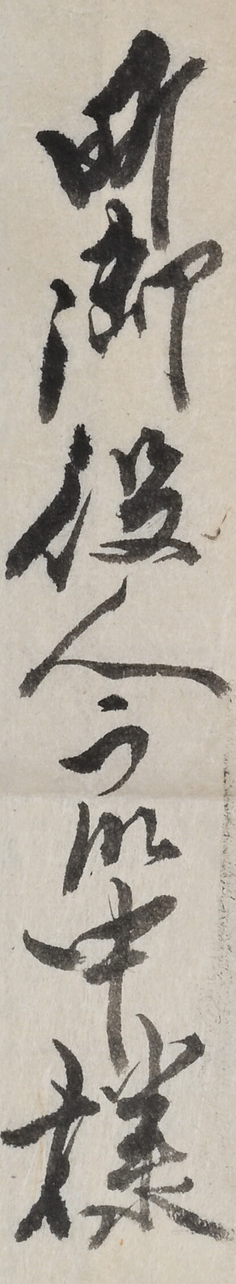町御役人衆中様

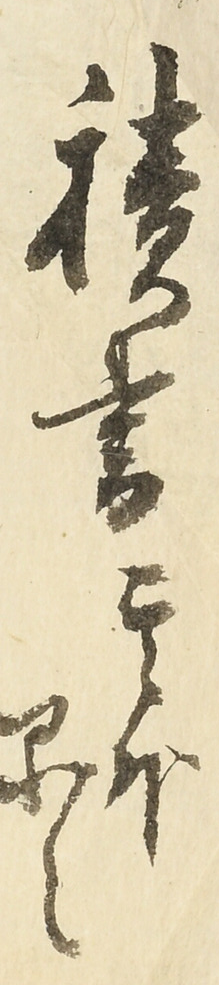積書其外

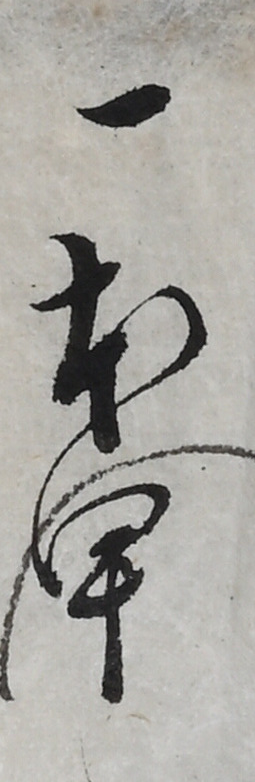一本甲
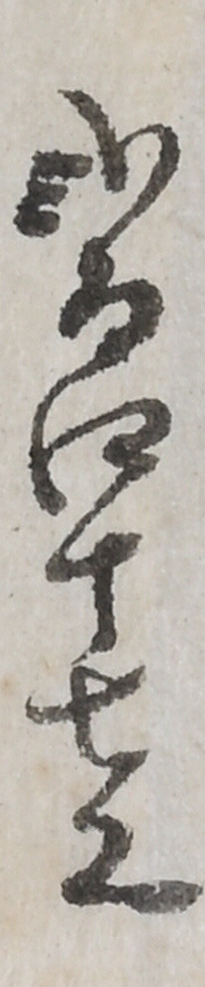弐百四十七工
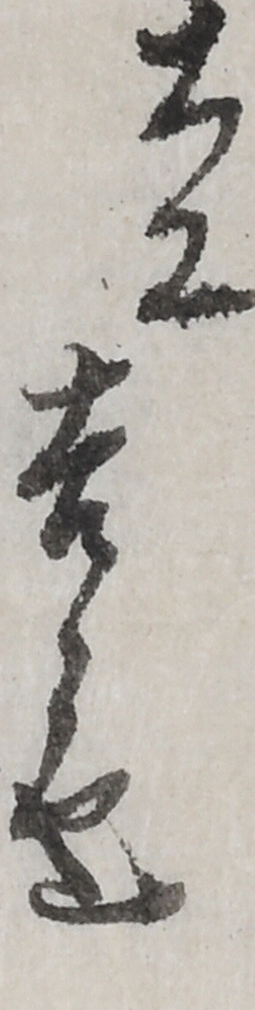吉兵衛
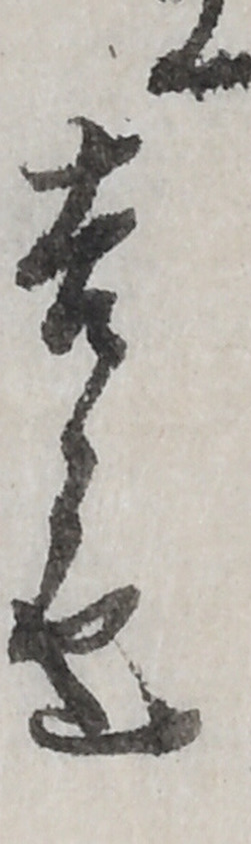吉兵衛
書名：町方木戸御普請諸事附（一括）
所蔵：伊那市立高遠町図書館・合同会社AMANE
